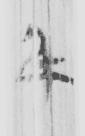身
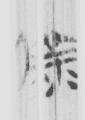備
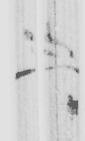之
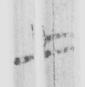上
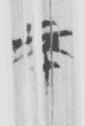下
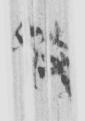{它攴}
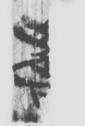{爻言}
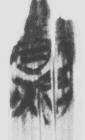則
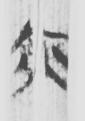亦
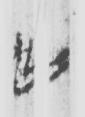亡
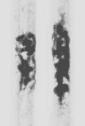責
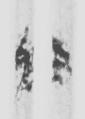於
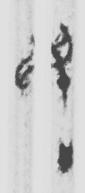民
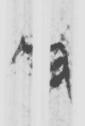今
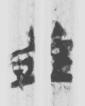或
